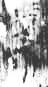福
